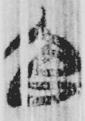官
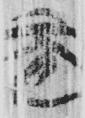而
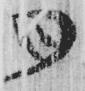月
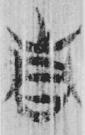青（請）
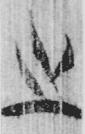之
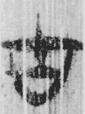古（故）
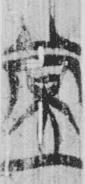堂（當）
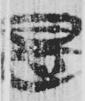是
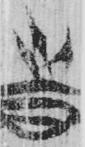○（時）
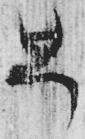也
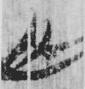亡
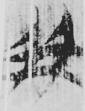並
